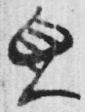見
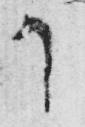人
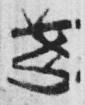武
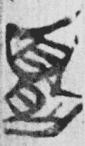履
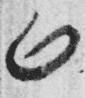㠯（以）
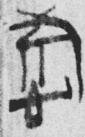○（祈）
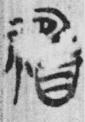禱
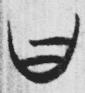曰
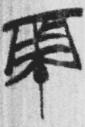帝
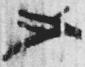之
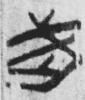武
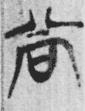尚
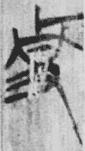史（使）
